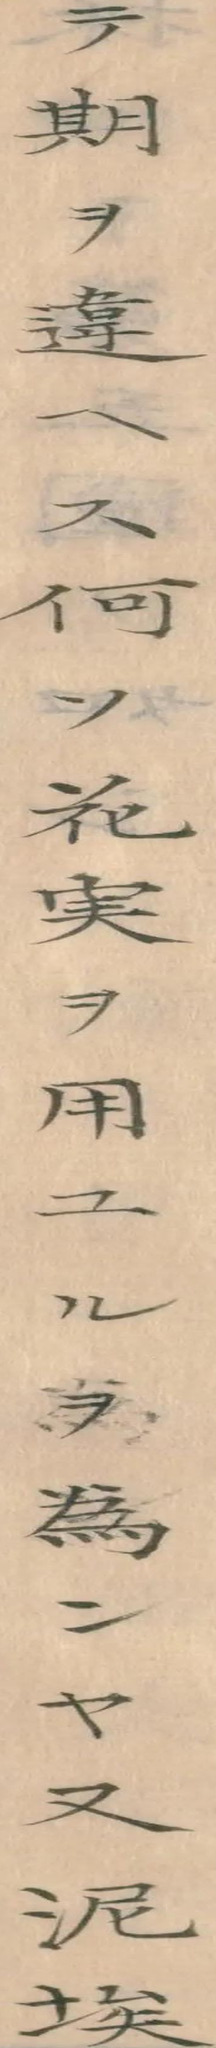テ期ヲ違ヘス何ソ花実ヲ用ユルヲ為ンヤ又泥埃
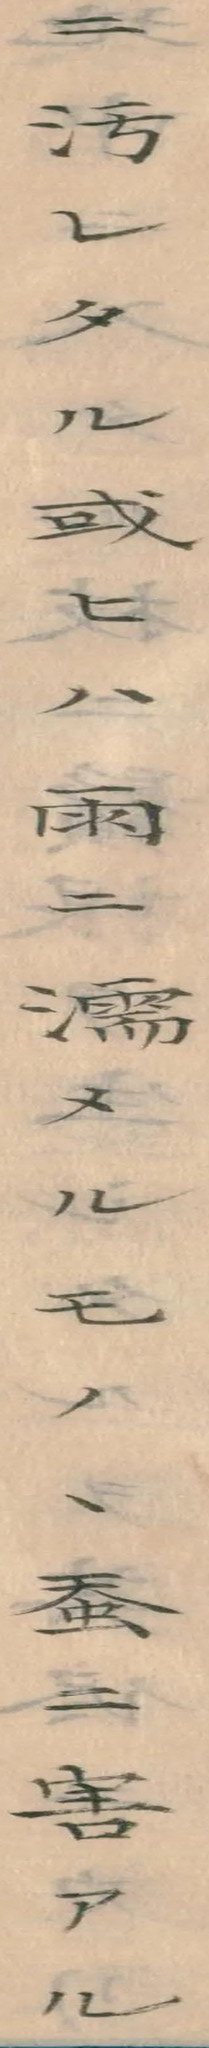ニ汚レタル或ヒハ雨ニ濡メルモノヽ蚕ニ害アル
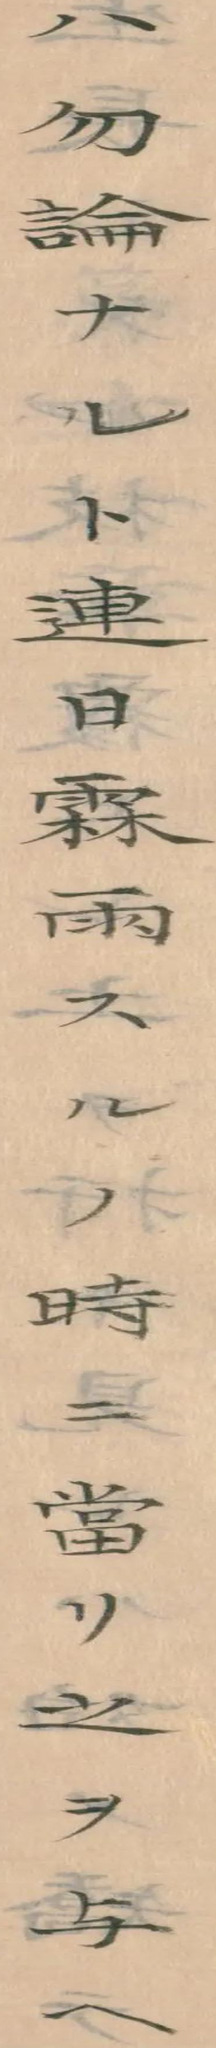ハ勿論ナレト連日霖雨スルノ時ニ当リ之ヲ与ヘ
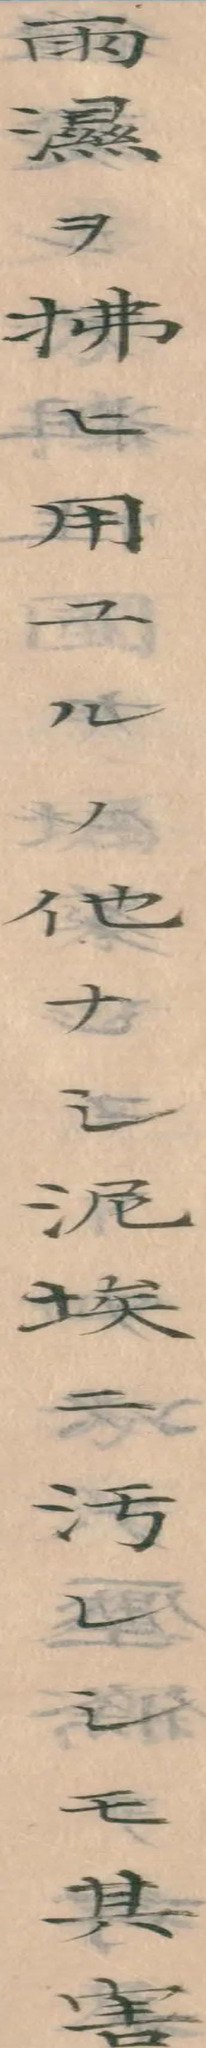雨湿ヲ払ヒ用ユルノ他ナシ泥埃ニ汚レシモ其害
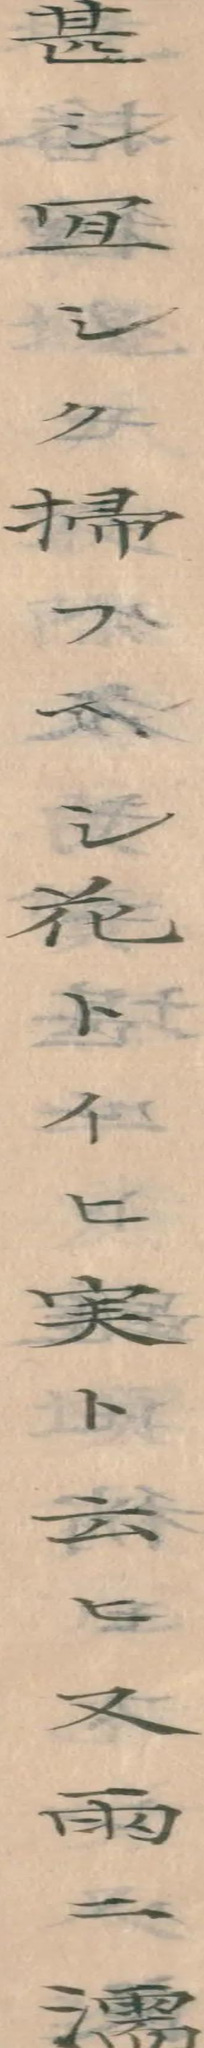甚シ宜シク掃フヘシ花トイヒ実ト云ヒ又雨ニ濡
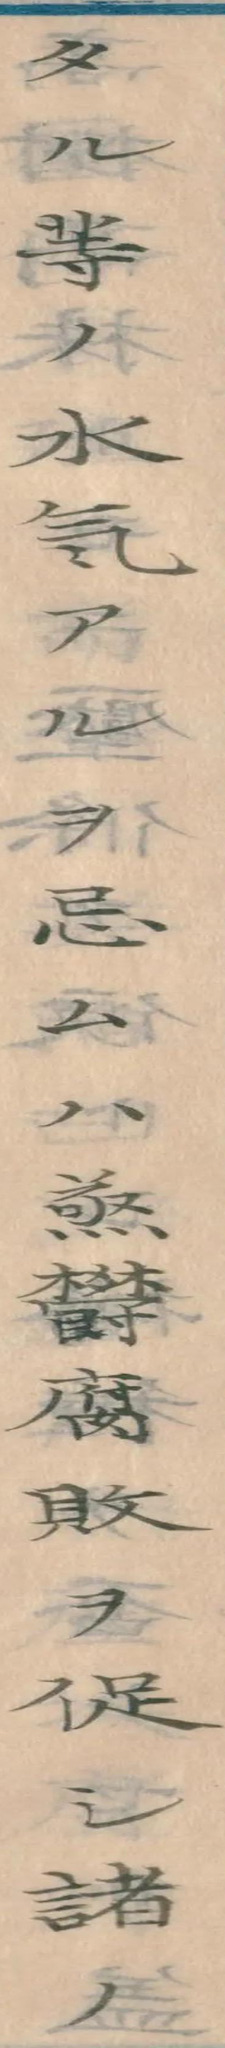タル等ノ水気アルヲ忌ムハ蒸鬱腐敗ヲ促シ諸ノ
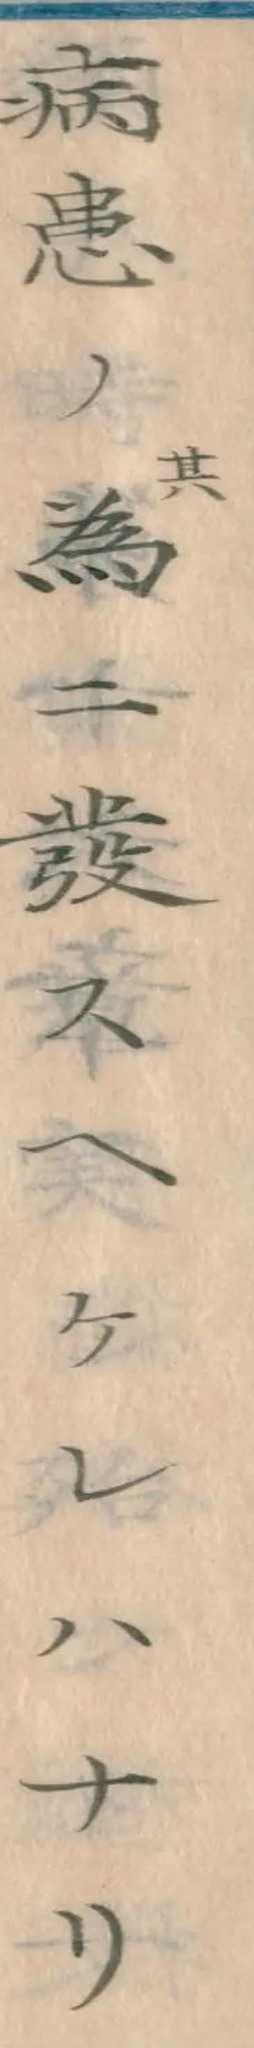病患ノ為ニ発スヘケレハナリ
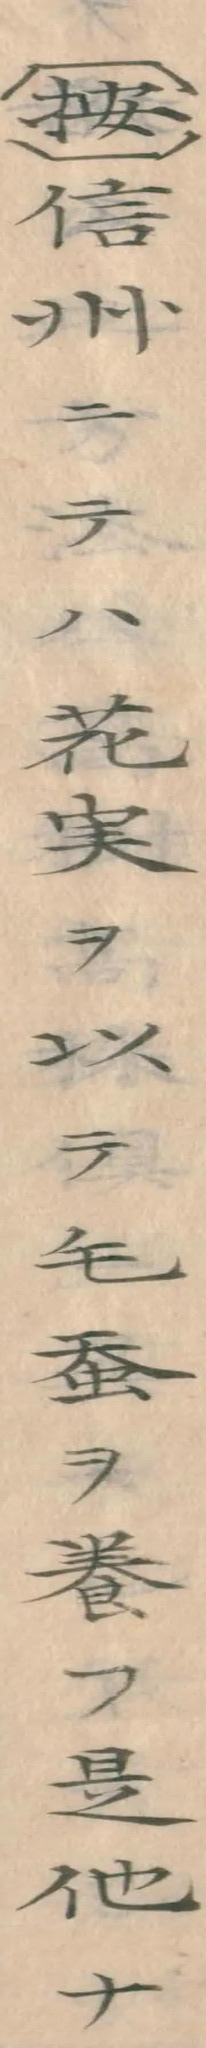[按]信州ニテハ花実ヲ以テ毛蚕ヲ養フ是他ナ
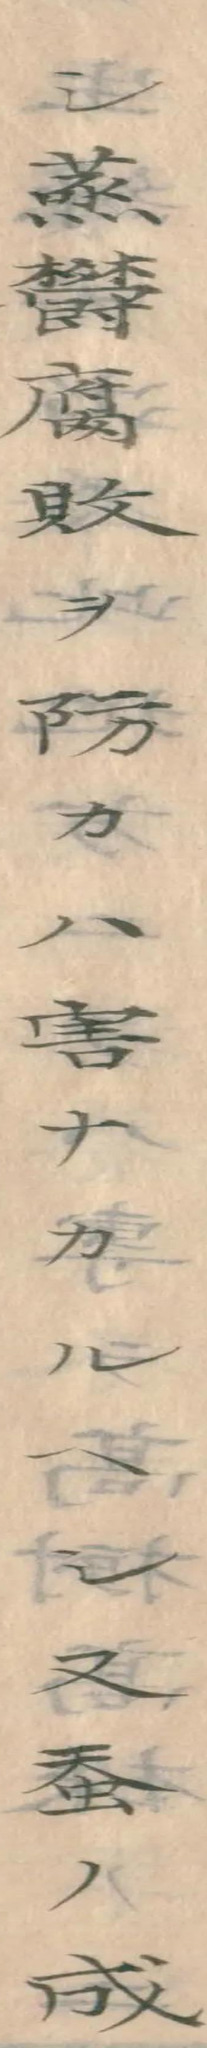シ蒸鬱腐敗ヲ防カハ害ナカルヘシ又蚕ノ成
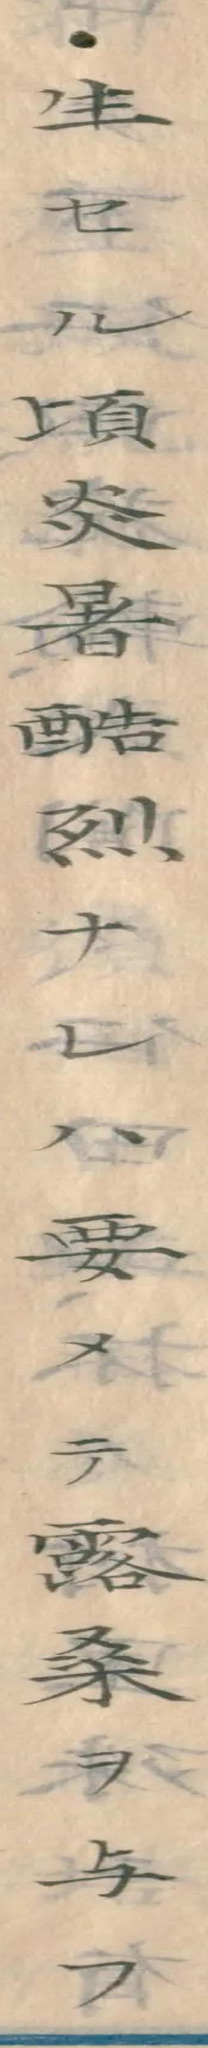生セル頃炎暑酷烈ナレハ要メテ露桑ヲ与フ
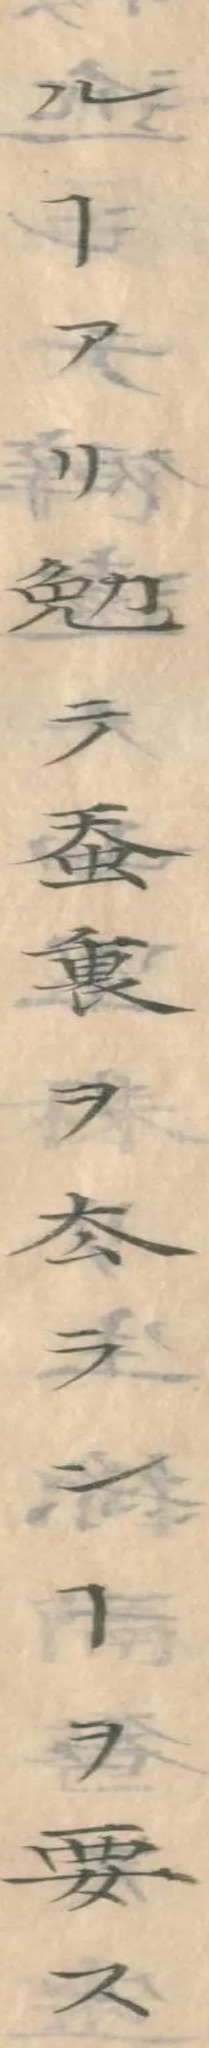ルコトアリ勉テ蚕裏ヲ去ランコトヲ要ス
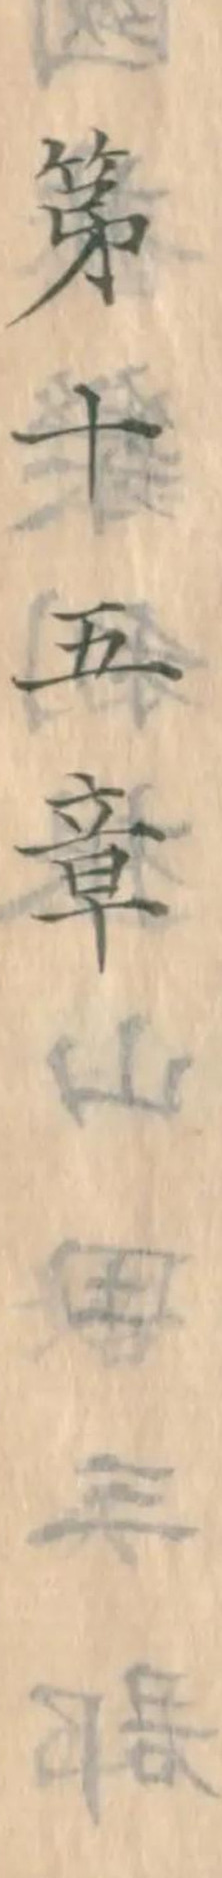第十五章
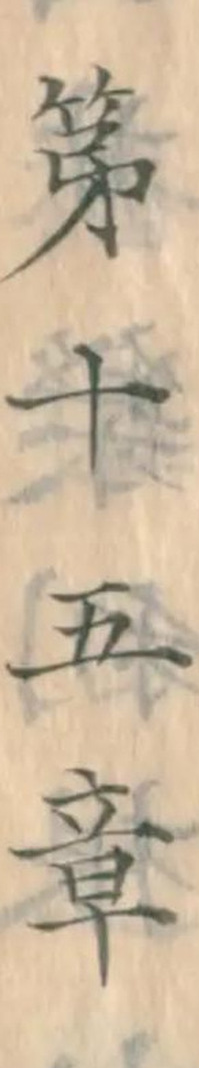第十五章

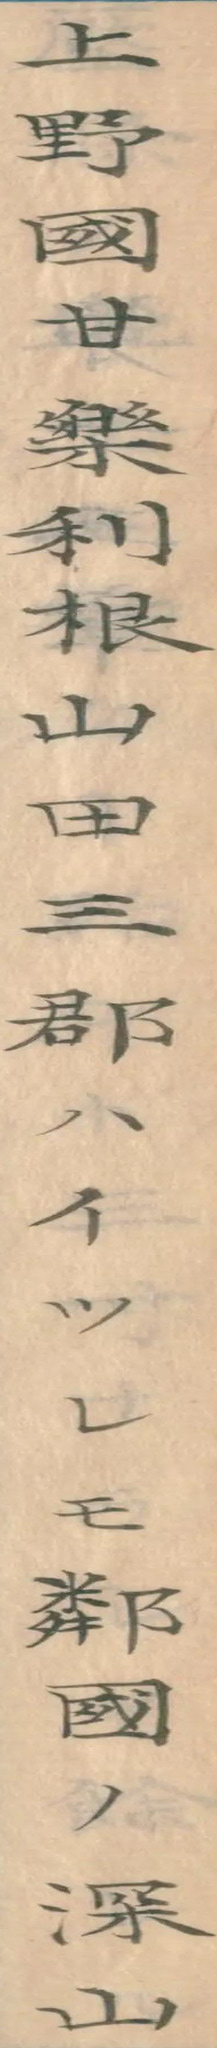上野国甘楽利根山田三郡ハイツレモ鄰国ノ深山
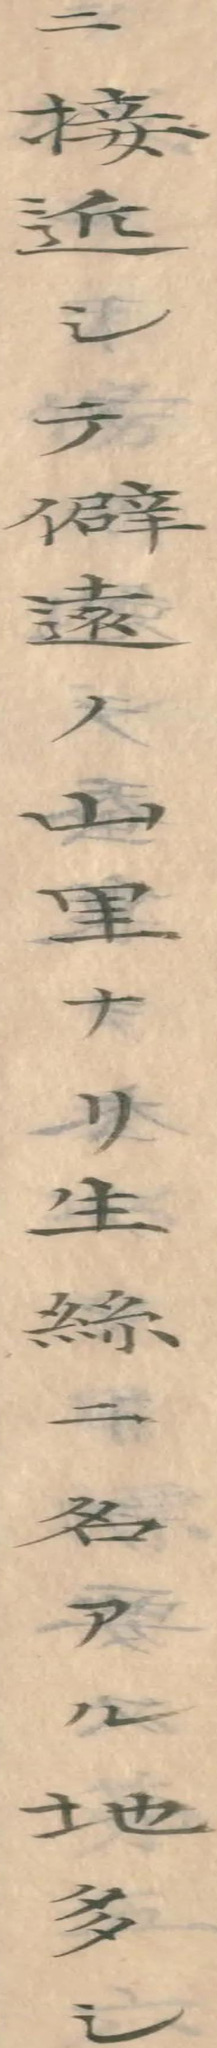ニ接近シテ僻遠ノ山里ナリ生糸ニ名アル地多シ
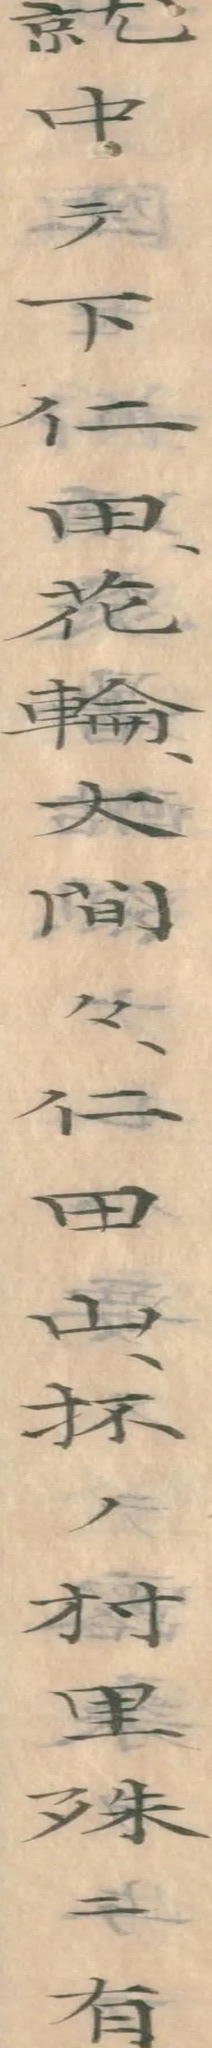就中テ下仁田、花輪、大間々、仁田山、抔ノ村里殊ニ有
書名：蚕桑集成
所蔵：国立国会図書館 National Diet Library, JAPAN
